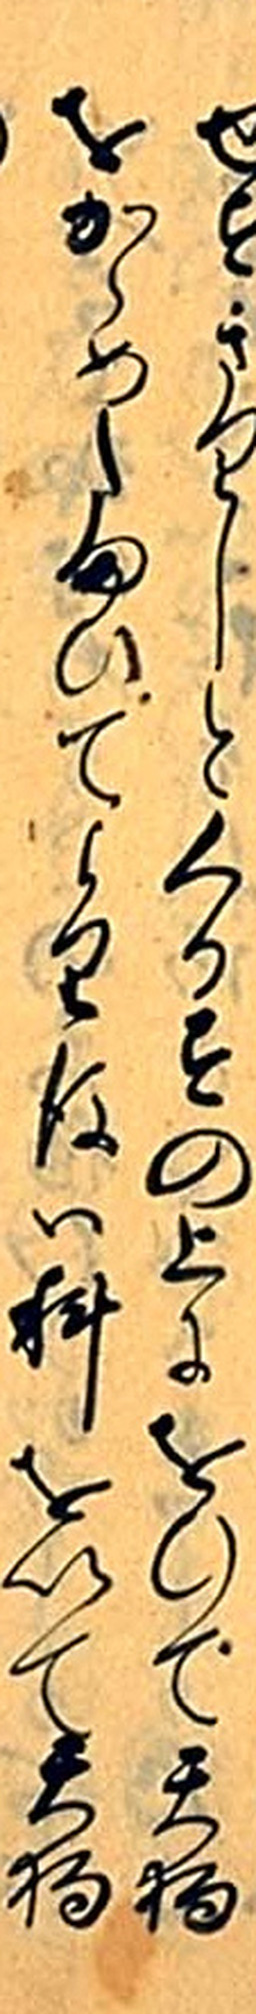をからめたまひてより後は科を以て天狗
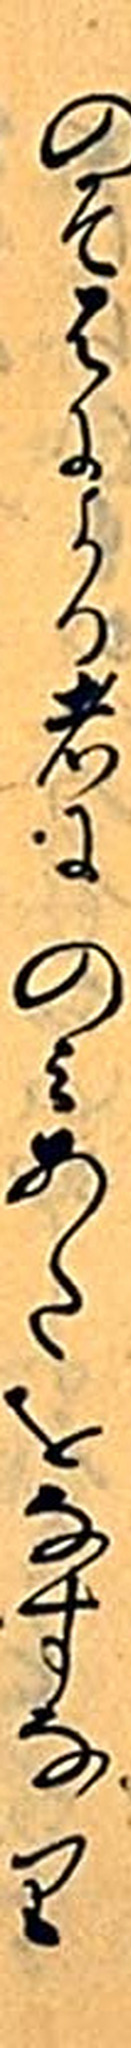のそはによる者にのみあたをなすなり
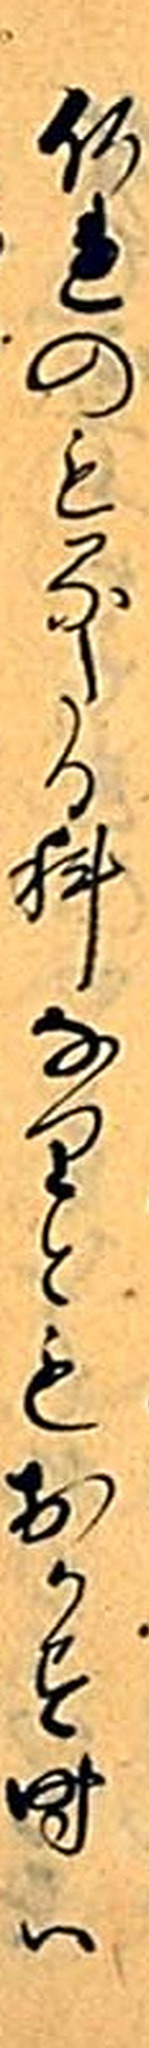何れのもるたる科なりともおかす時は
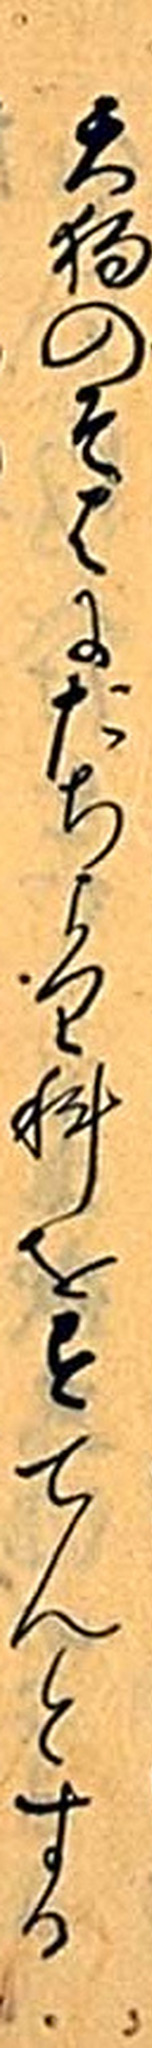天狗のそはにたちより科をすてんとする
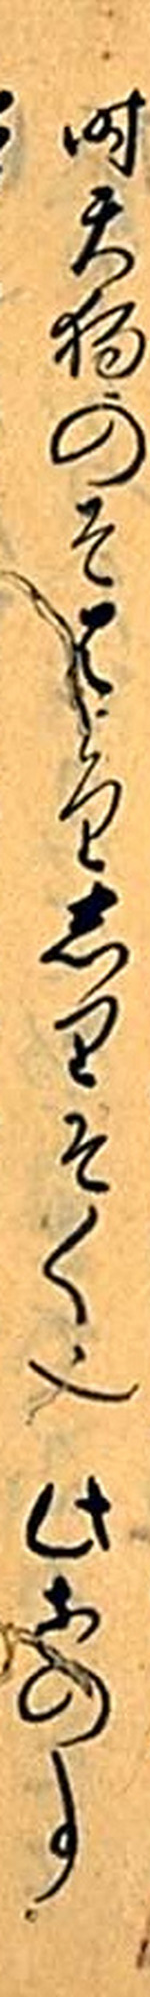時天狗のそはよりしりそく也此等の事
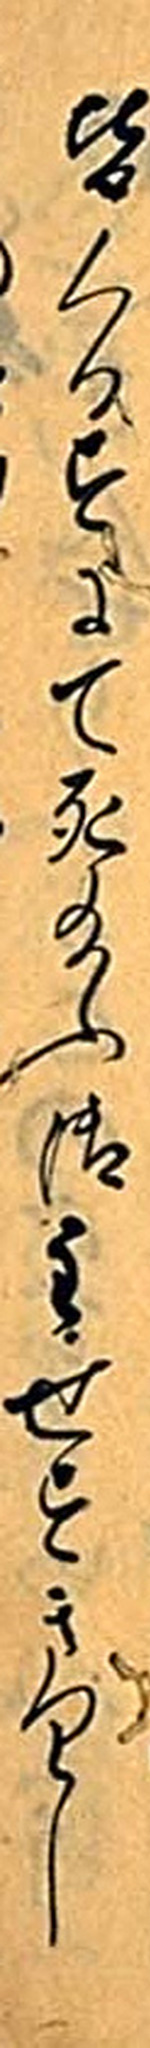皆くるすにて死給ふ御主せすきりし
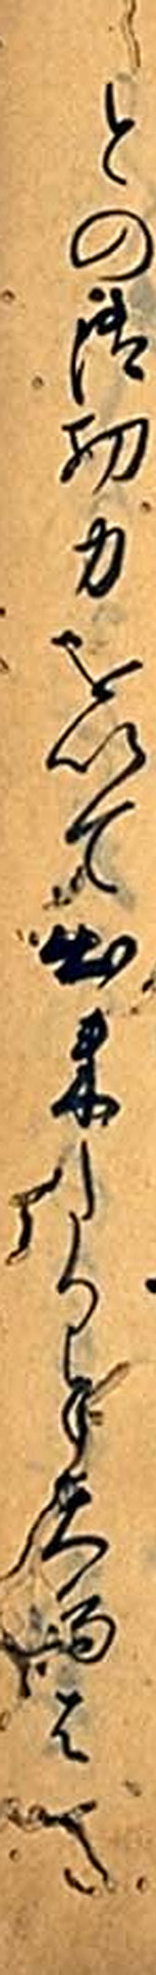との御功力を以て出来たる天狗は

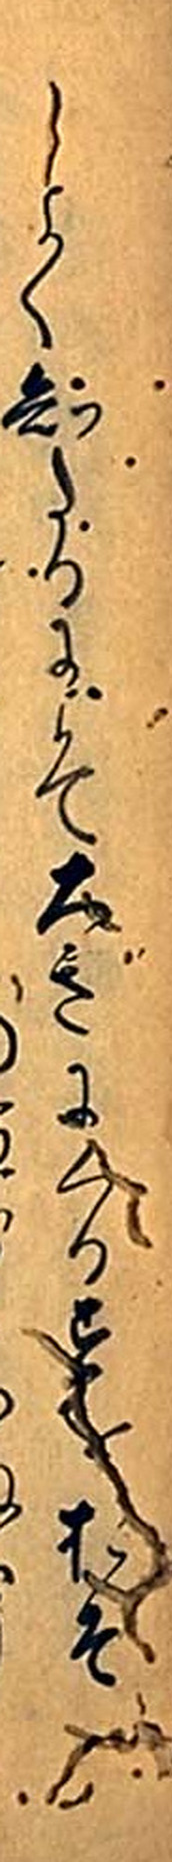よく知たるによて大きにくるすをおそ
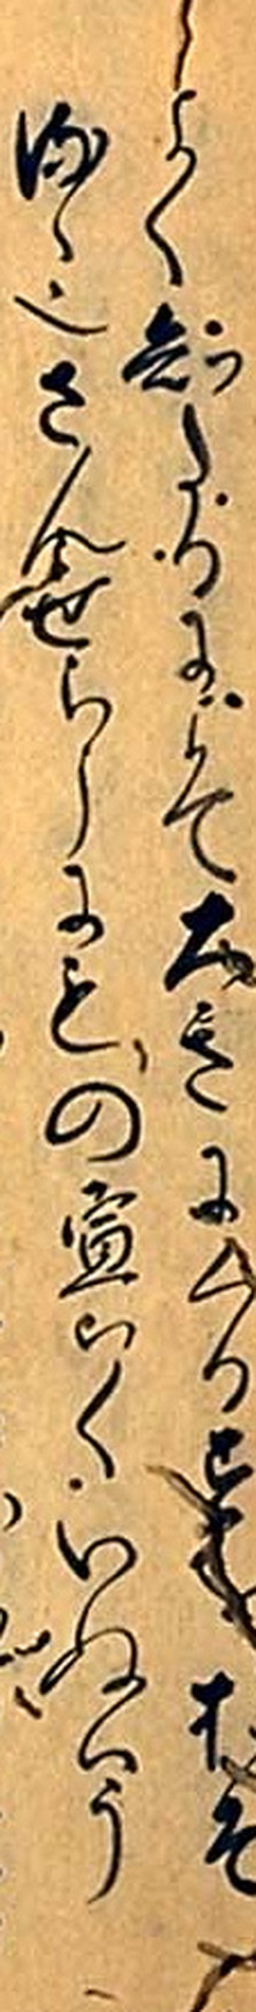るゝ也さんせらうにもの宣はくいぬはう
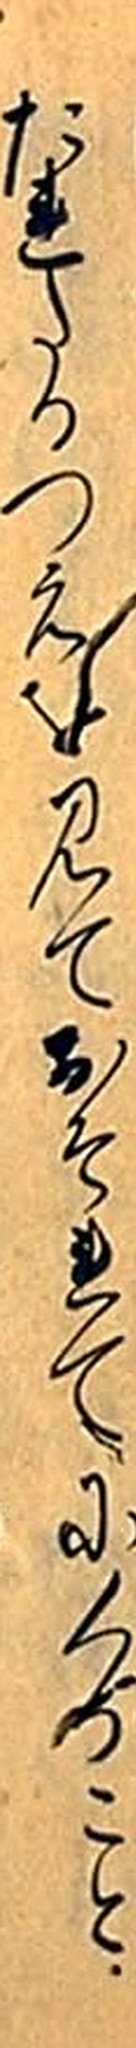たれたるつえを見ておそれてにくること
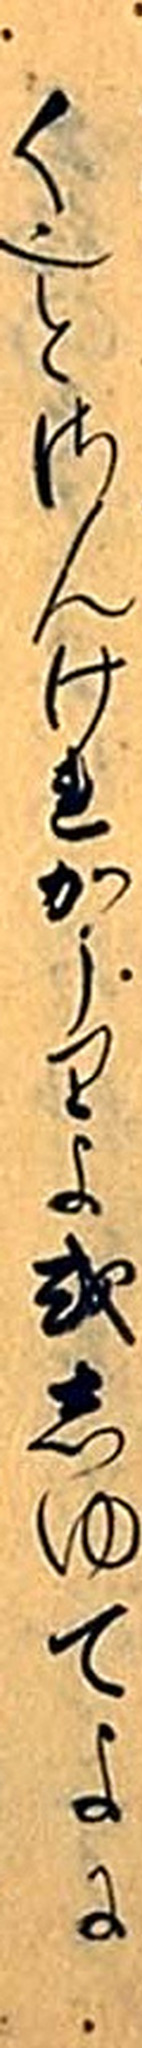く也とさんけれかうりよ或しゆてよに
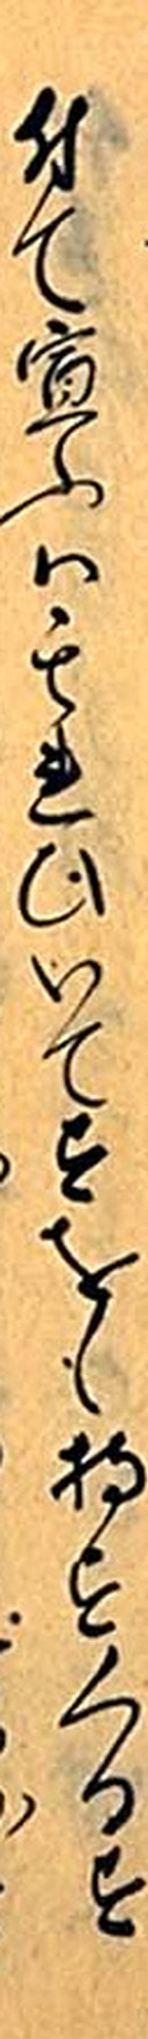付て宣ふは其れひいてすをも持すくるす
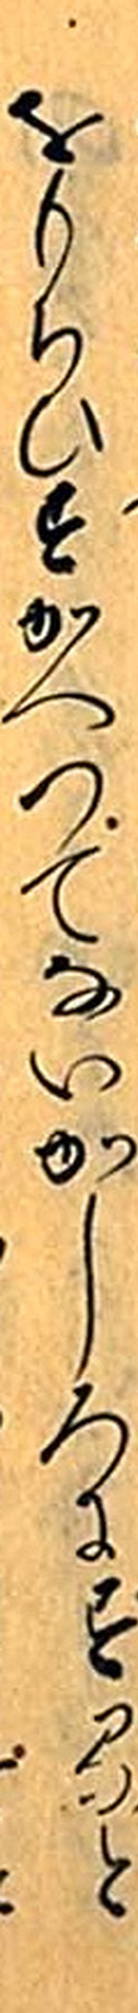をもちいすかへつてないかしろにすると
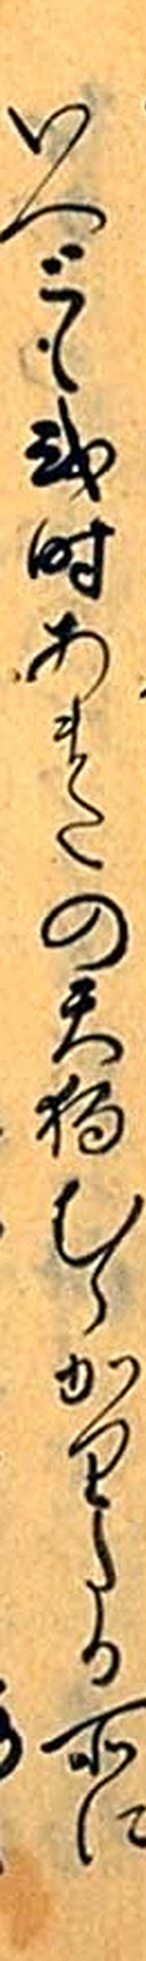いへとも或時あまたの天狗むらかりたる所に
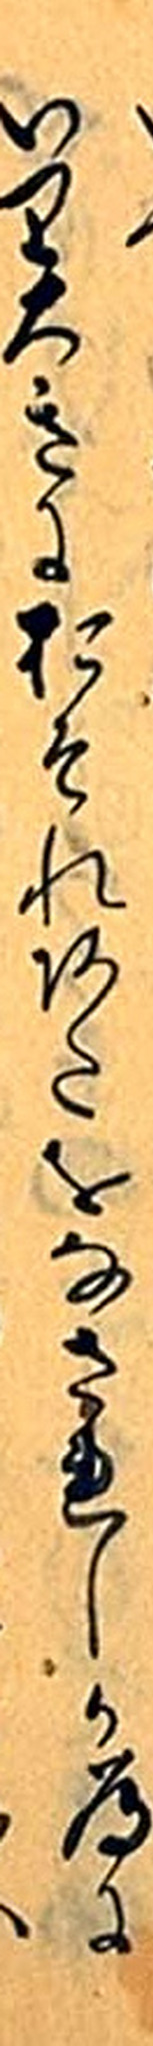いり大きにおそれあたをなされしか為に
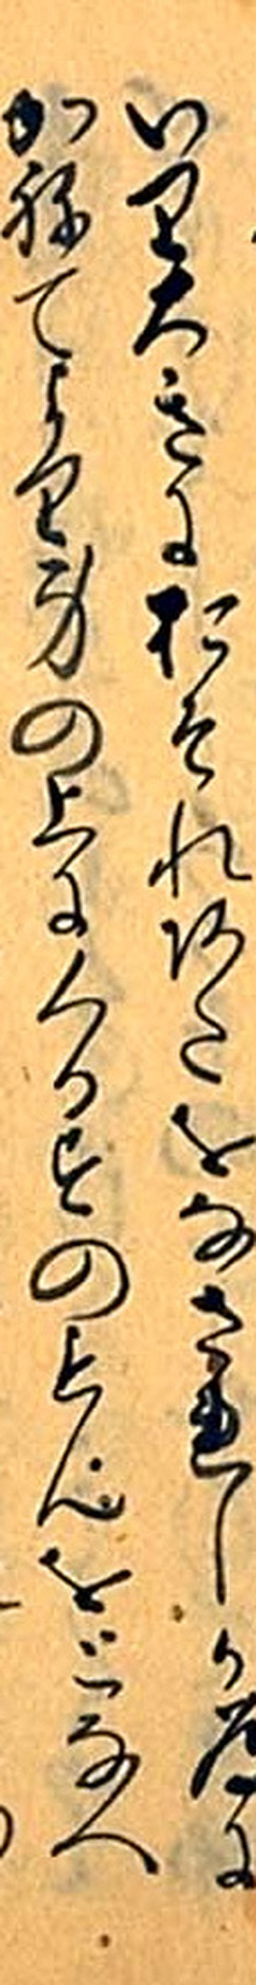かねてより身の上にくるすのもんをとなへ
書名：ドチリナ・キリシタン
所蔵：東京大学総合図書館 / General Library in the University of Tokyo
